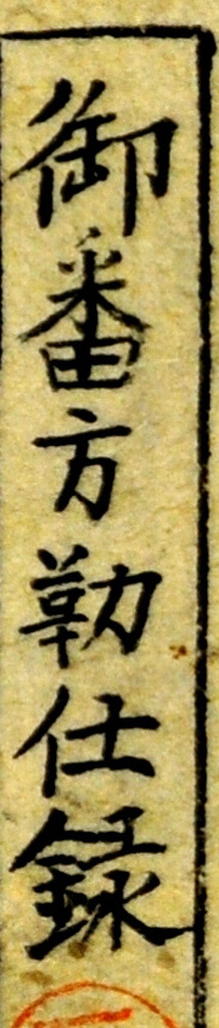御番方勤仕録

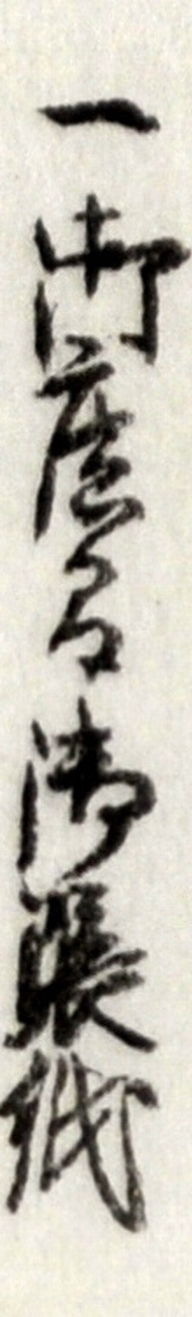一御広間御張紙
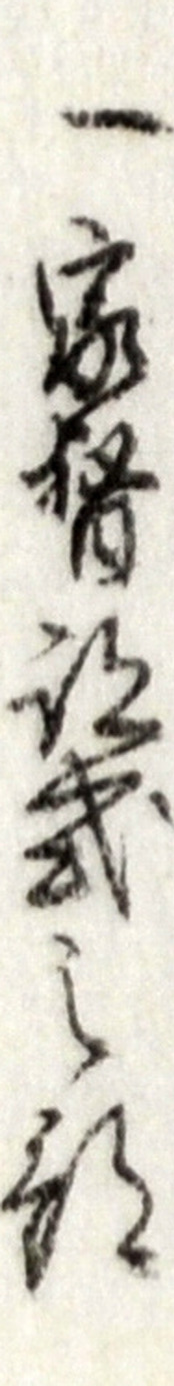一家督跡式之部
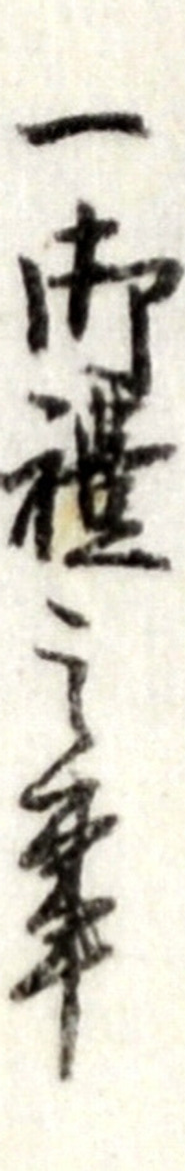一御礼之事
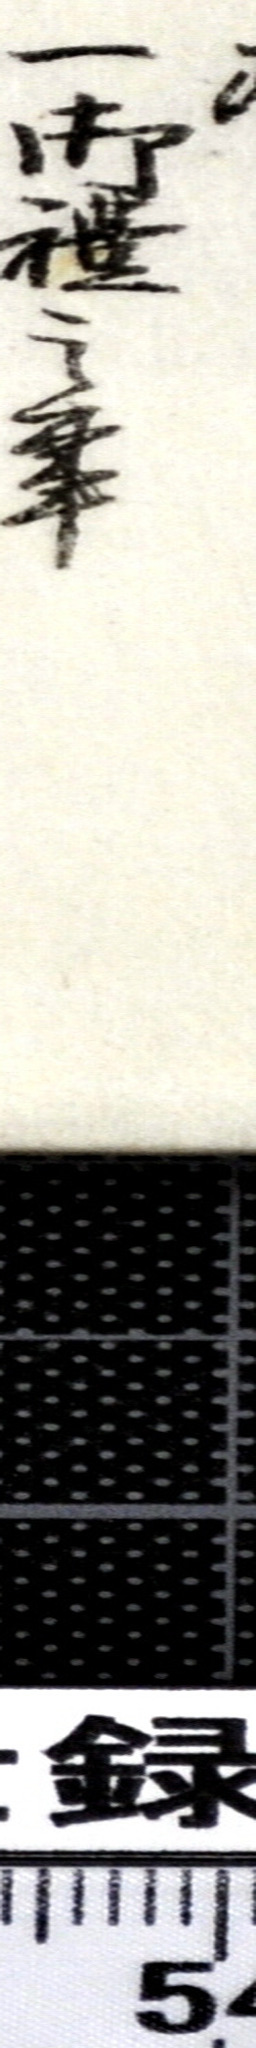一御礼之事
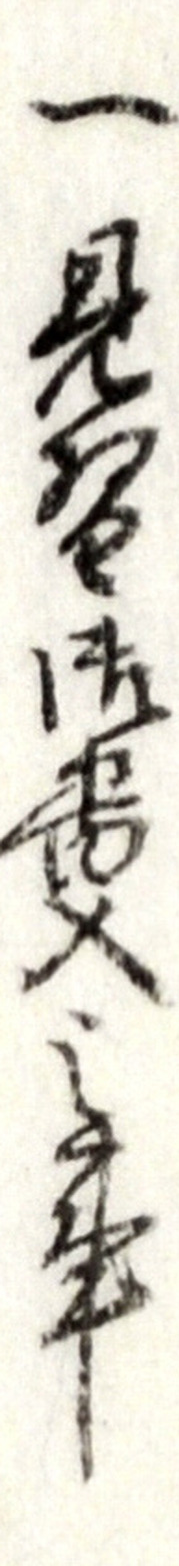一見習御番入之事
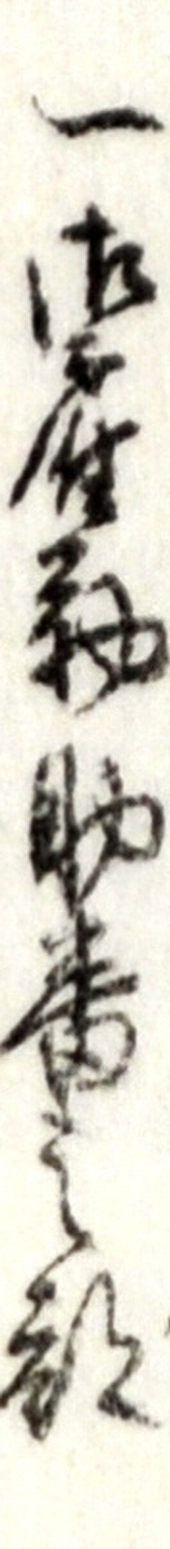一御雇勤助番之部
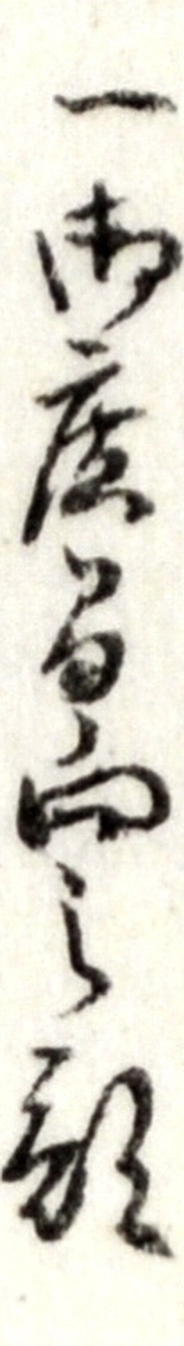一御広間向之部
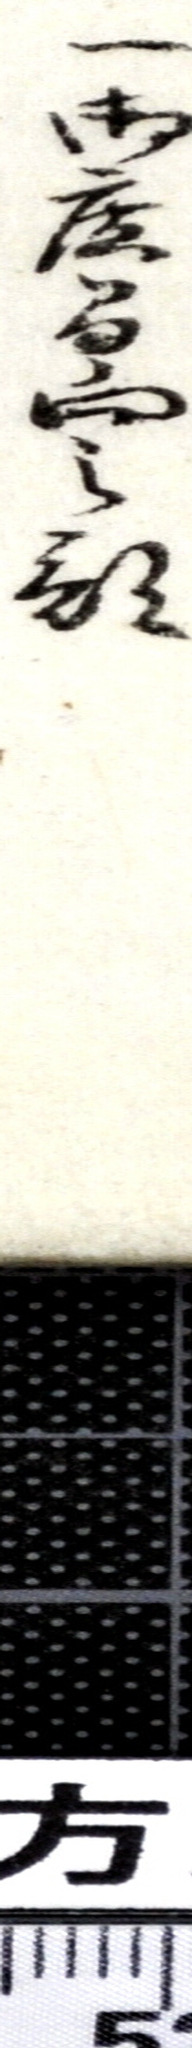一御広間向之部
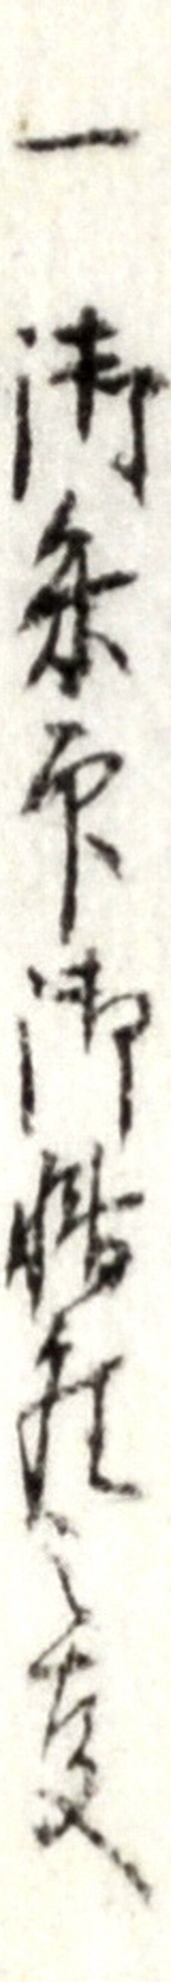一御朱印御◻︎座之事
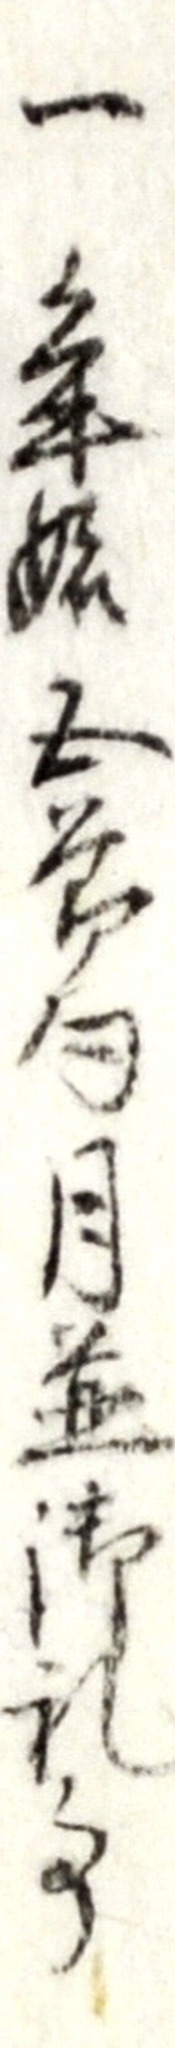一年始五節句月並御礼事
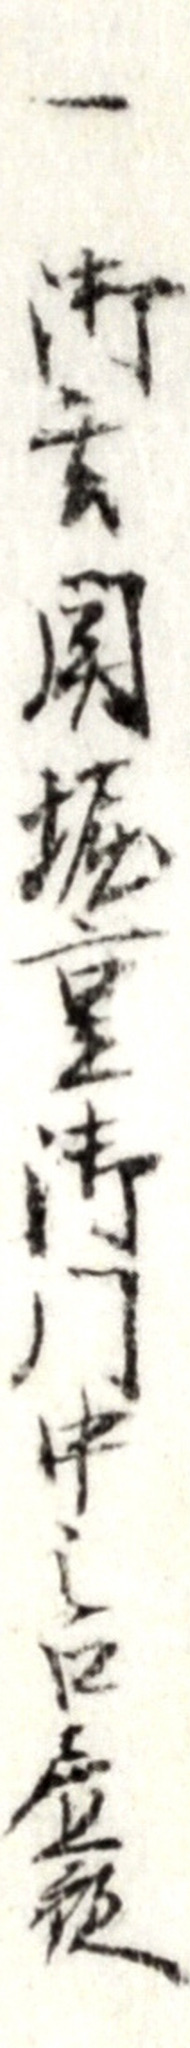一御玄関堀重御門中之口昼夜
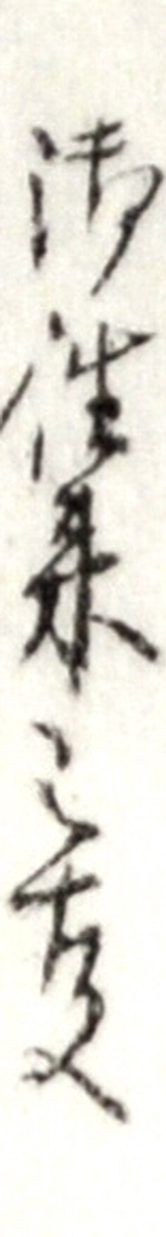御往来之事
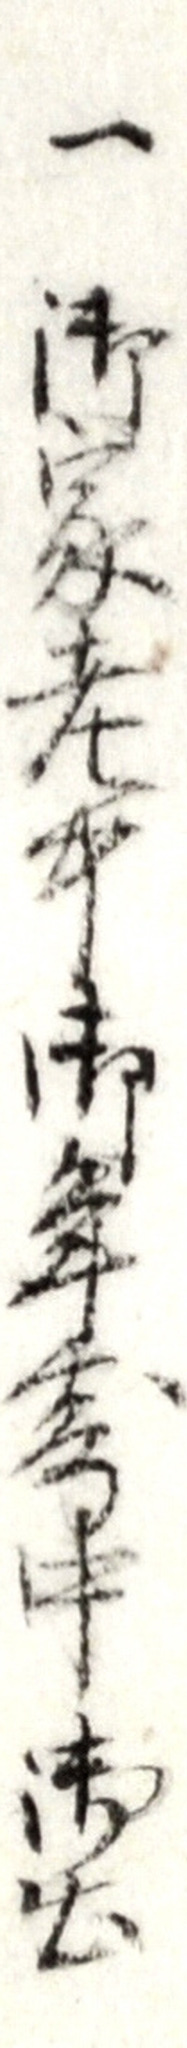一御家老中御年寄中御出
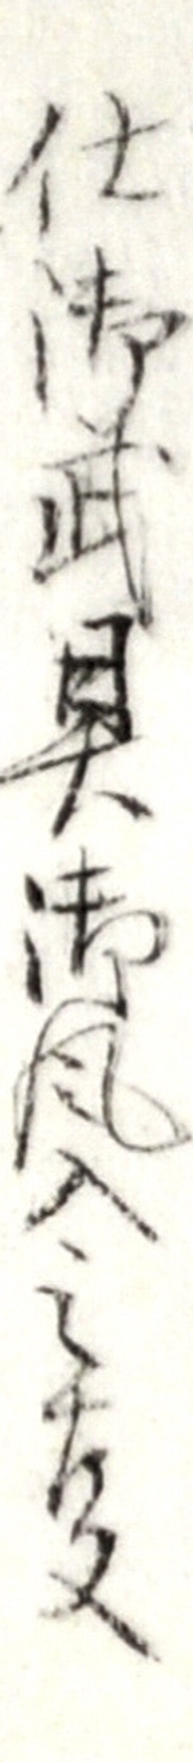仕御武具御風入之事
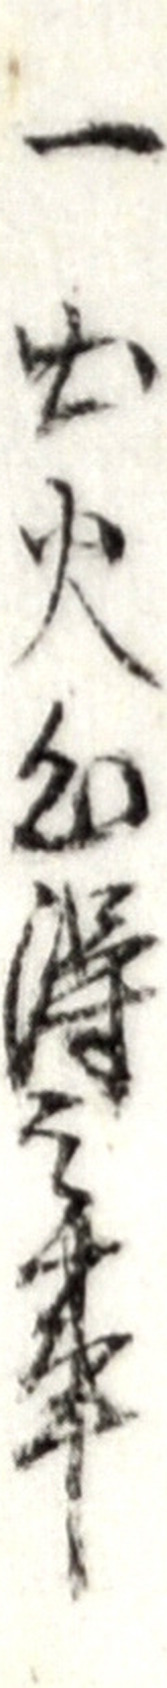一出火心得之事
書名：御番方勤仕録
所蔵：伊那市立高遠町図書館・合同会社AMANE
